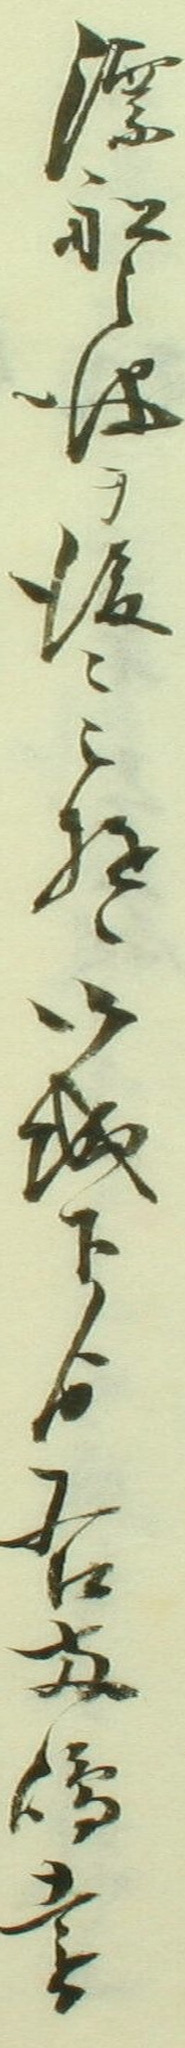漂船之儀ヲ後ニ被遊候御城下ゟ右両嶋遠
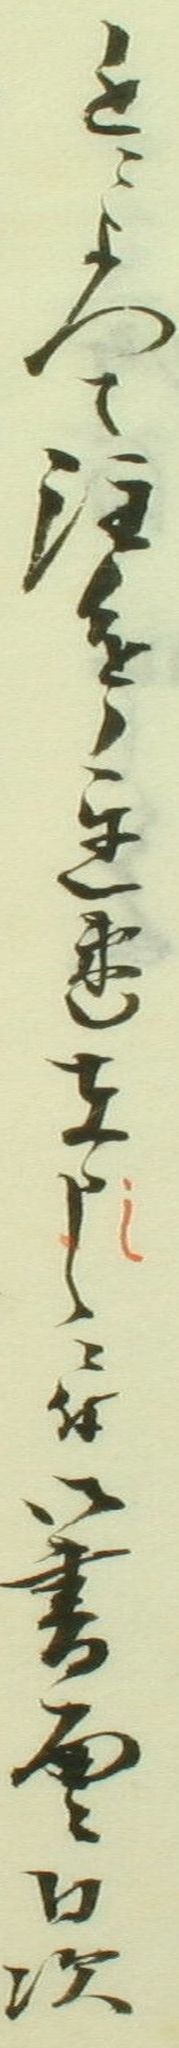近ニよつて注進ノ遅速在申ニ付御書面ニ日次
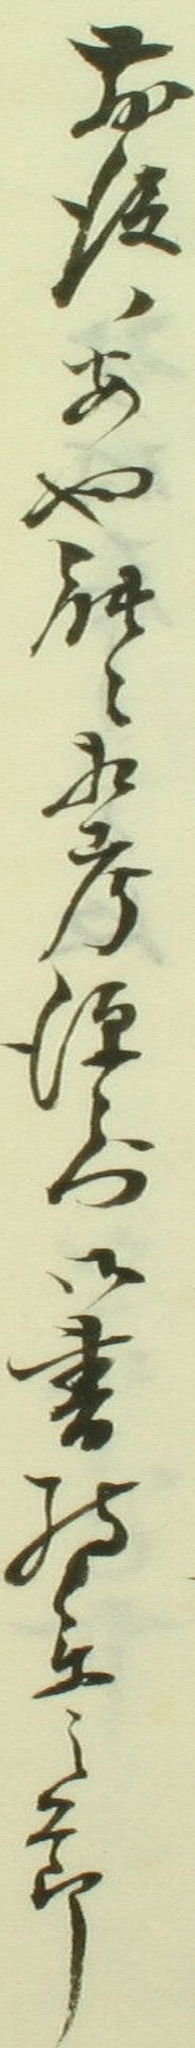前後ノあや能々相考源右衛門御書持参之節
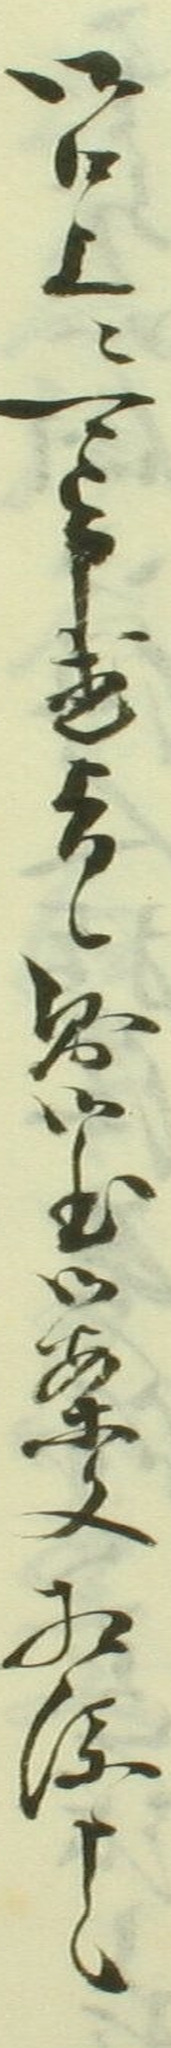御口上ニ可被申述旨候則御書御案文相添申候
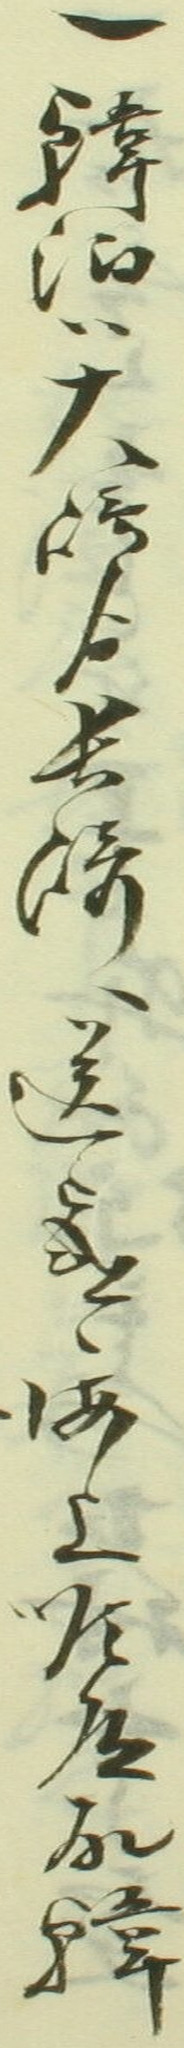一韓泊ハ大嶋ゟ長崎へ送被遣候海上順道故韓
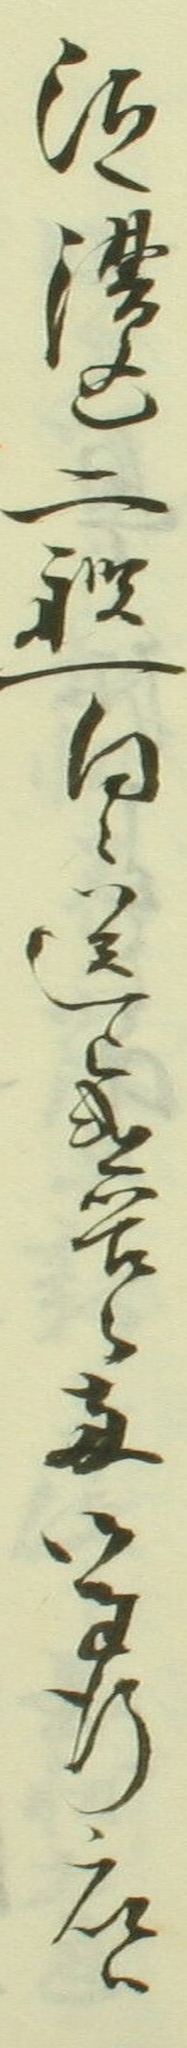泊へ漕込二艘一向ニ送被遣筈候両御奉行衆ハ
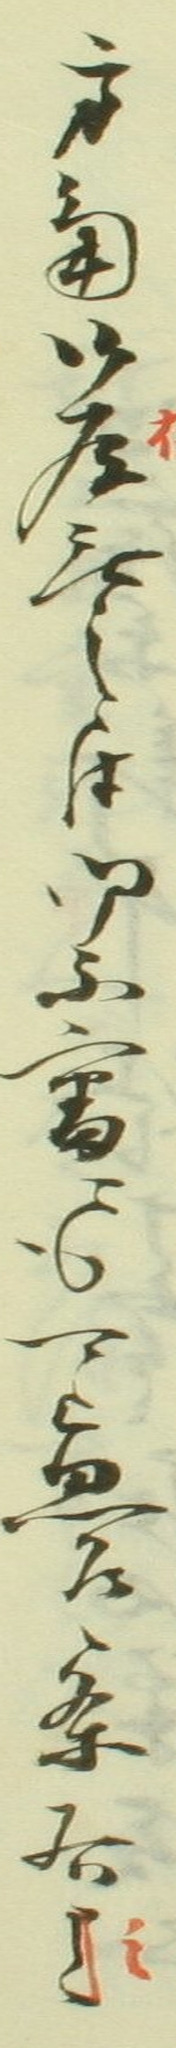方角御存無之候付御不審にも可被思召候条右之
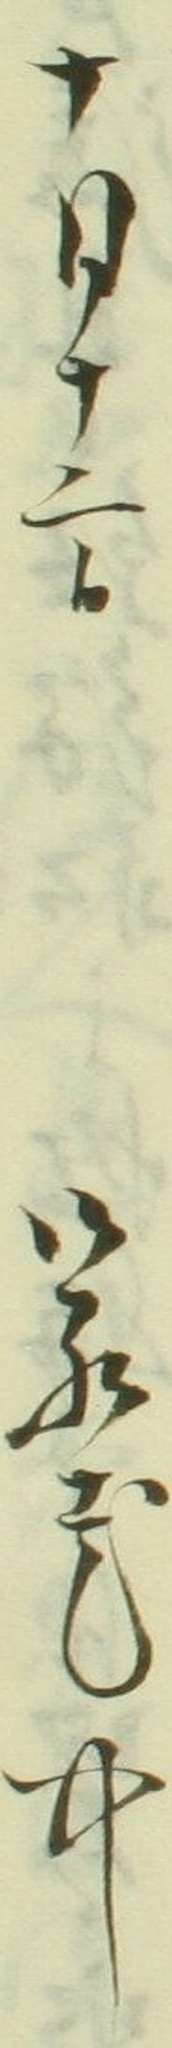十月十二日御家老中
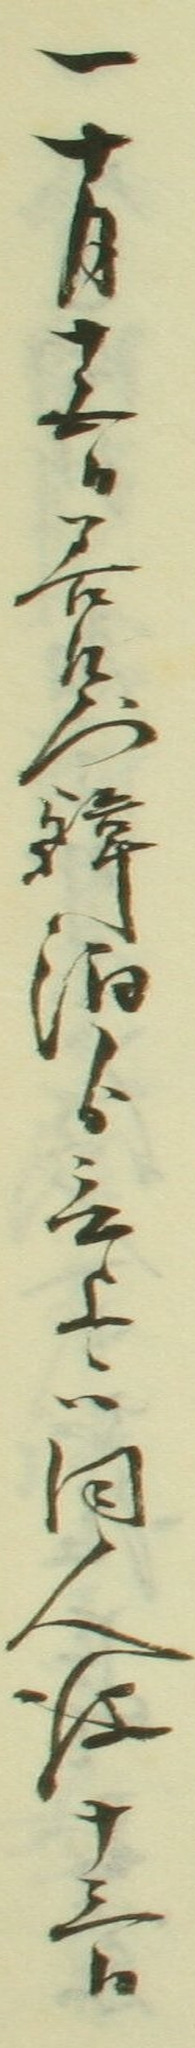一十月十五日善左衛門韓泊ゟ言上候ハ同人儀十三日

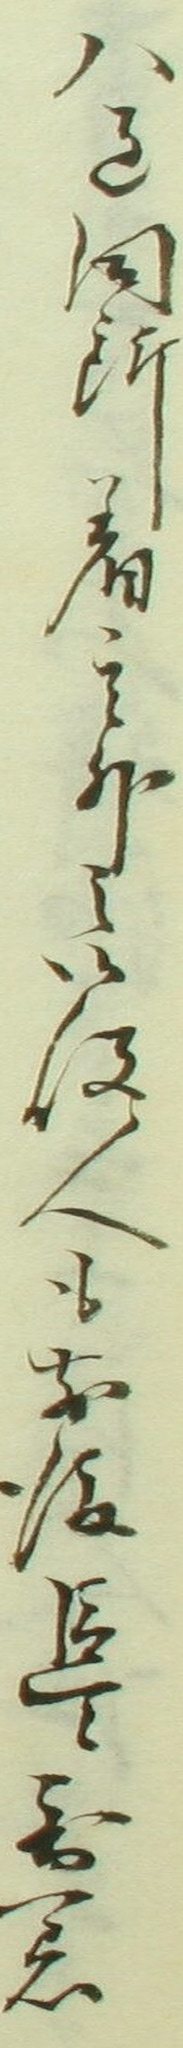八過同所着其外之御役人も前後追々到着
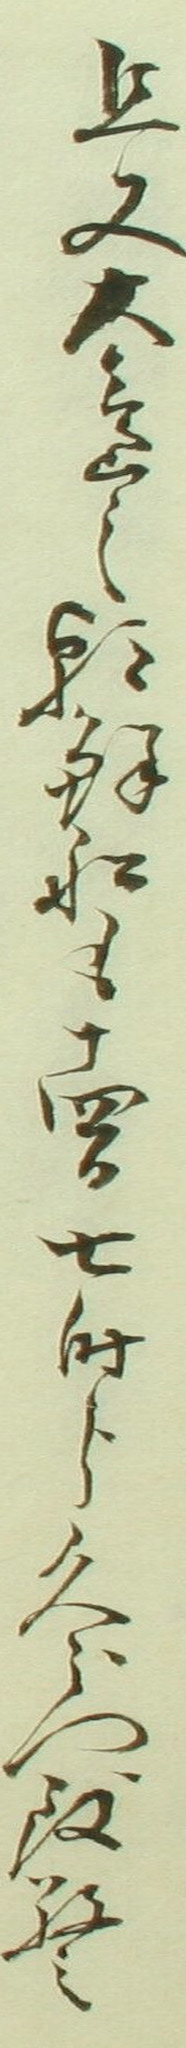且又大嶋之朝鮮船も十四日七時分久右衛門へ致警
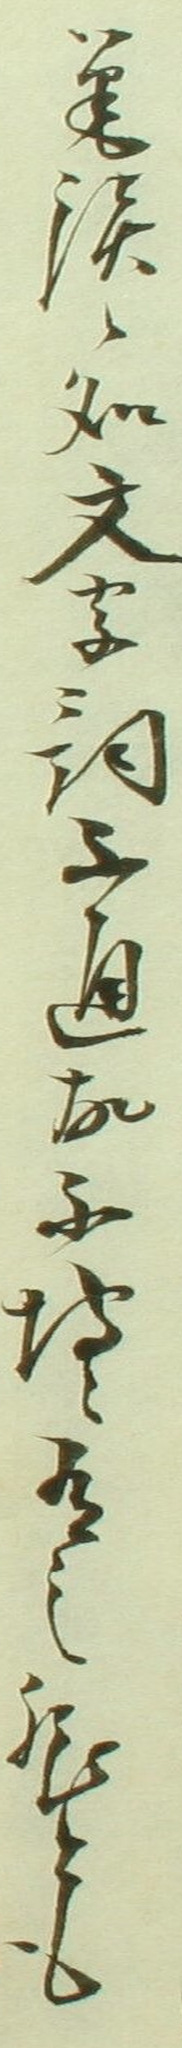筆談候処文字詞不通故不埒ニ有之然とも
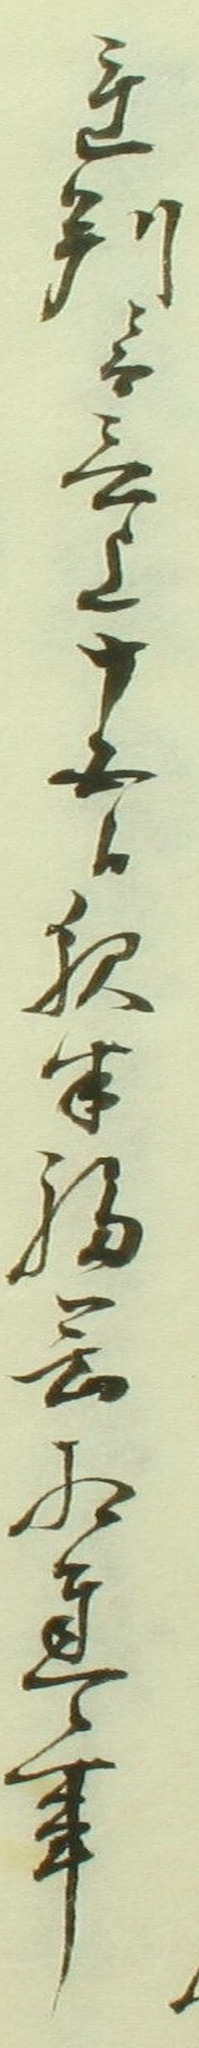連判ニ而言上十五日夜半福岡相達候事
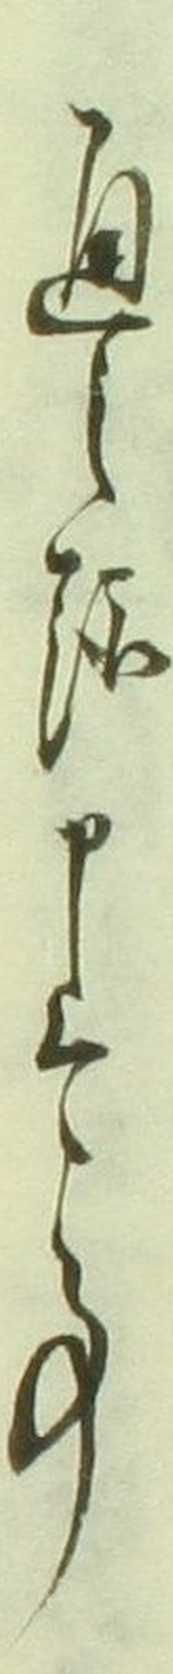通之趣申上候事
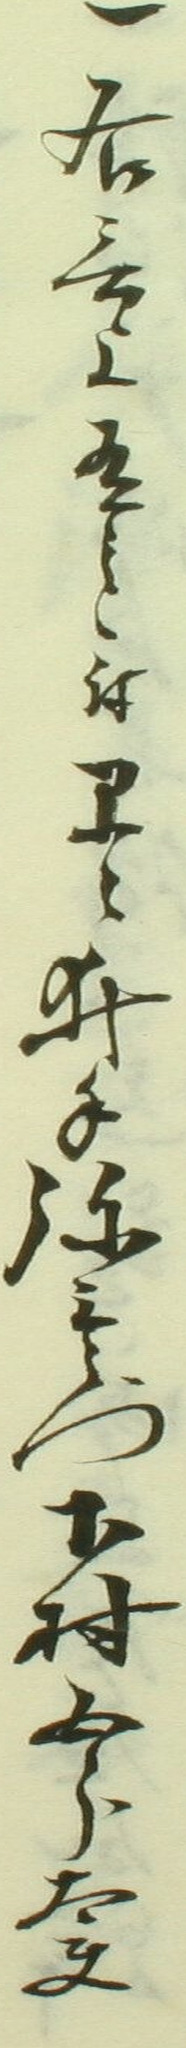一右言上有之候付早々井手弥三右衛門下村五郎太夫
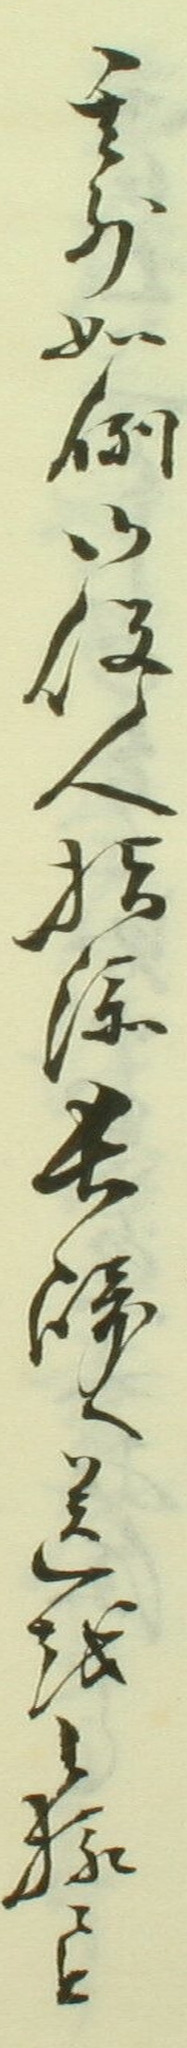其外如例御役人指添長崎へ送越候様ニと
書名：異国船漂着記
